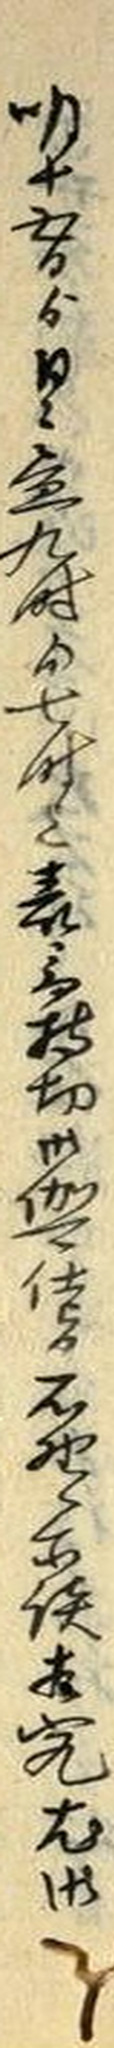明十五日ゟ日々昼九時ゟ七時迄表ニ而持切御伽可仕旨石野へ示談相究尤御
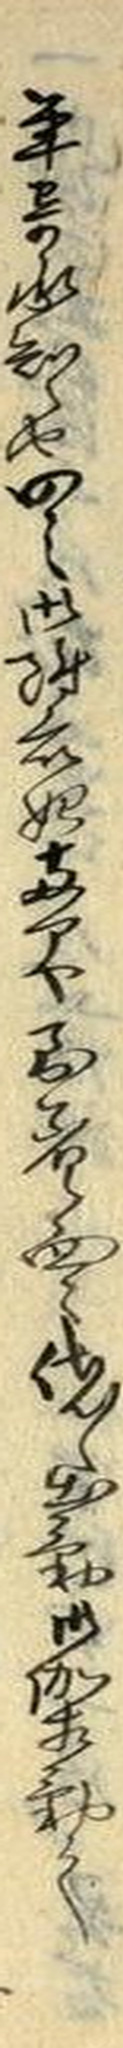年寄承知候由仍之御附衆始両部や到着之面々代ㇽ〳〵出勤御伽相勤之
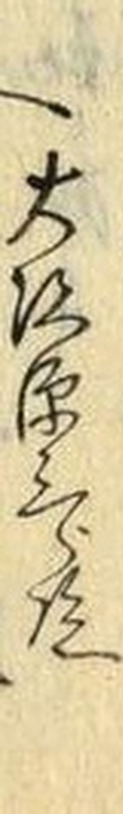大沢源三郎殿
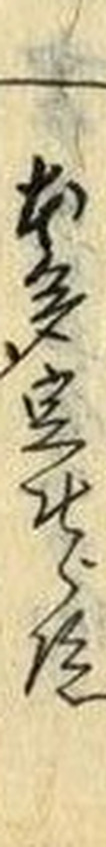本多定次郎殿
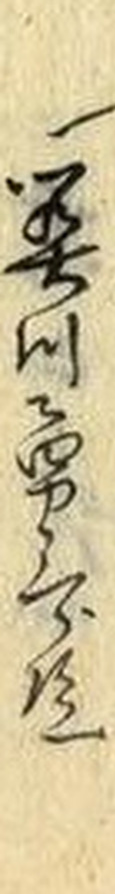関川勇三郎殿
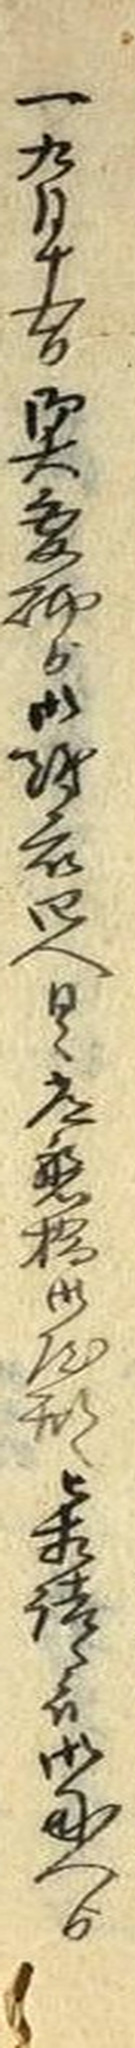一九月十五日御大変砌ゟ御附衆四人日々常磐橋御屋形へ被相詰候ニ付御用人ゟ
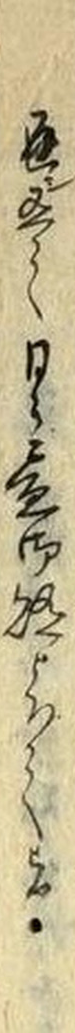通シ有之日々昼御賄被下之旨
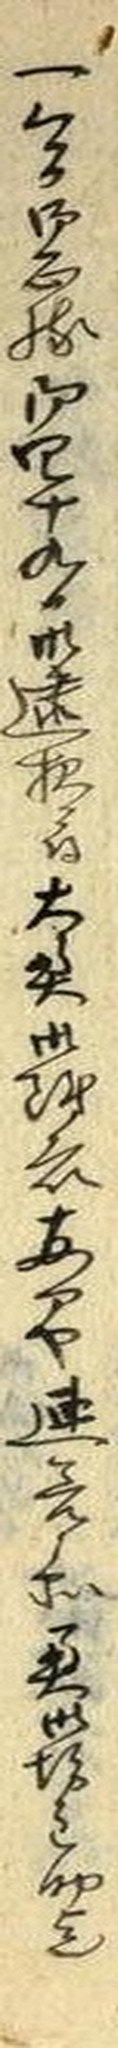一今日御正統御四十九日御逮夜大奥御附衆両部や連善兵衛奥御坊主助迄
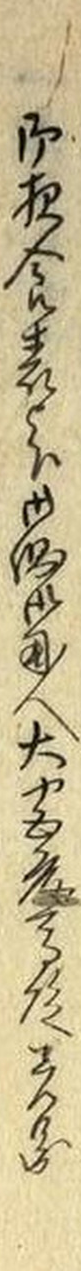御夜食表被下御側御用人大宮藤馬殿差図
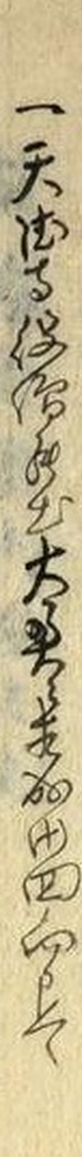一天徳寺役僧罷出大奥ニ相成御回向申上候
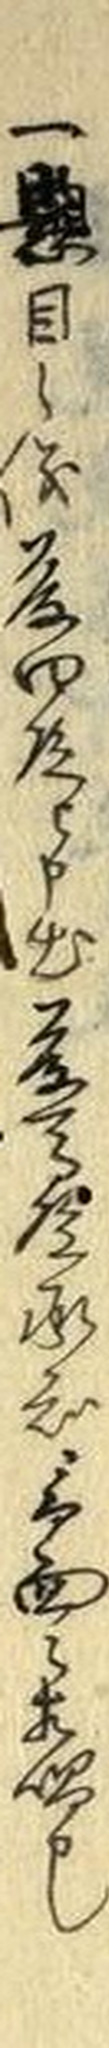一題目之儀藤田殿被申出藤馬殿承知ニ而面々相唱申候
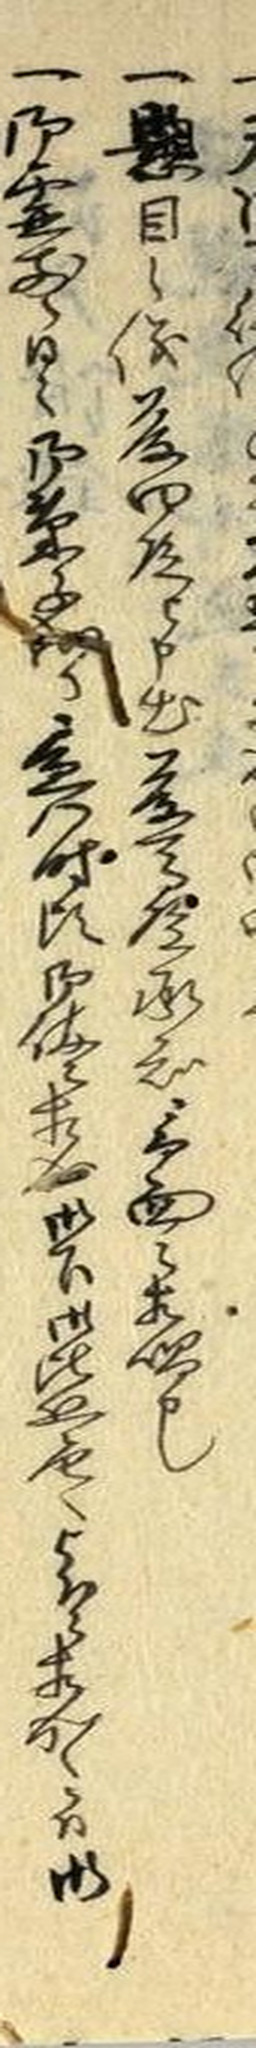一御霊前へ日々御菓子掛り昼八時頃御備ニ相成御下御比丘尼へ被下ニ相成候ニ付御
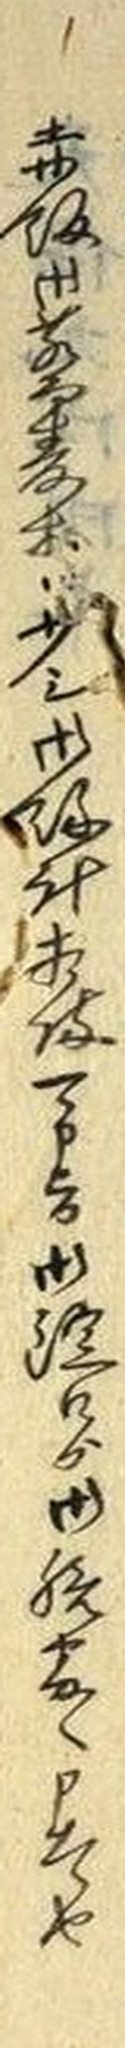赤飯御蕎麦等ハ少シ御余計相備可申旨御錠口ゟ御膳番へ申出候由
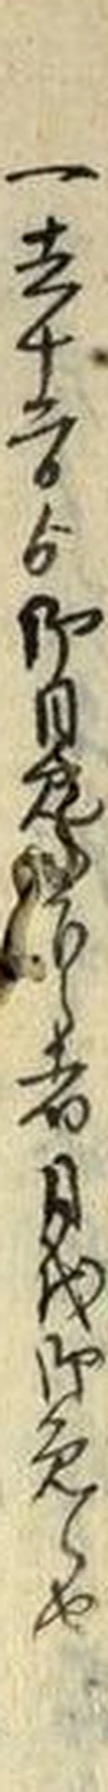一去十二日ゟ御目見被下候者月代御免候由
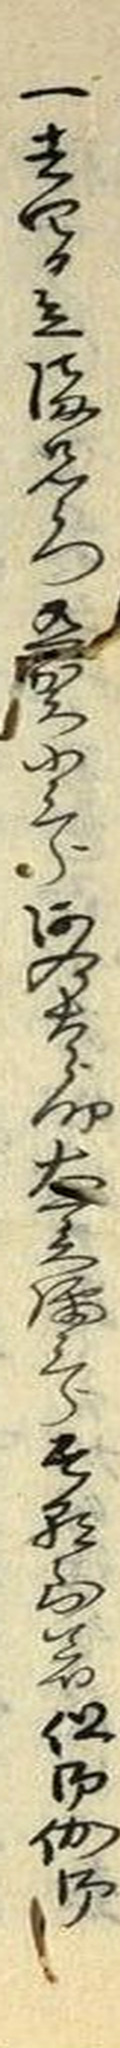一去四日立溝口郷右衛門有賀小三郎河合太郎助大関弥三郎今朝到着但御伽御
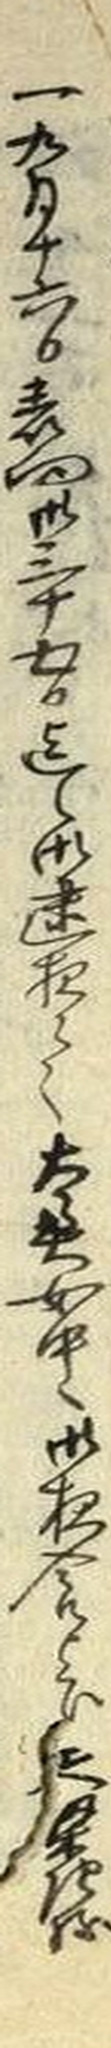一九月十六日表向御三十五日迄之逮夜ニて大奥女中へ御夜食被下天梁院様
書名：少傅日録抄（斉善付側向頭取日記、江戸并道中、初入在国、逝去後…
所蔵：福井県文書館 Fukui Prefectural Archives
